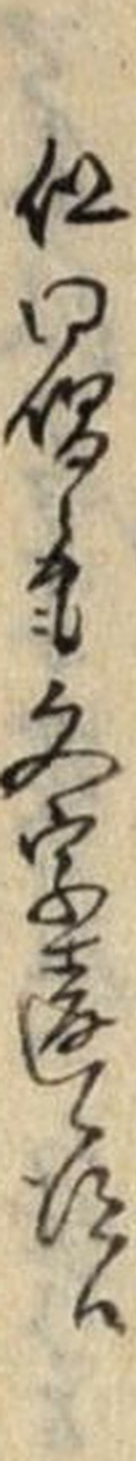但同唱に而も文字違候得は
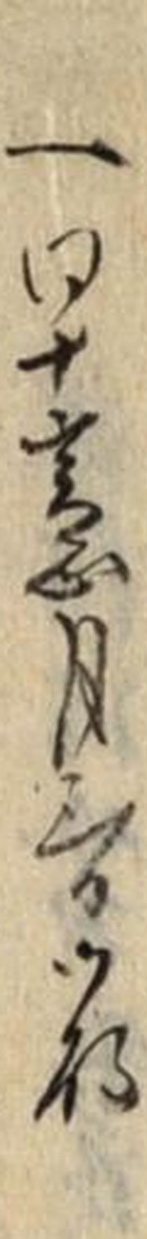一同十亥正月三日御触
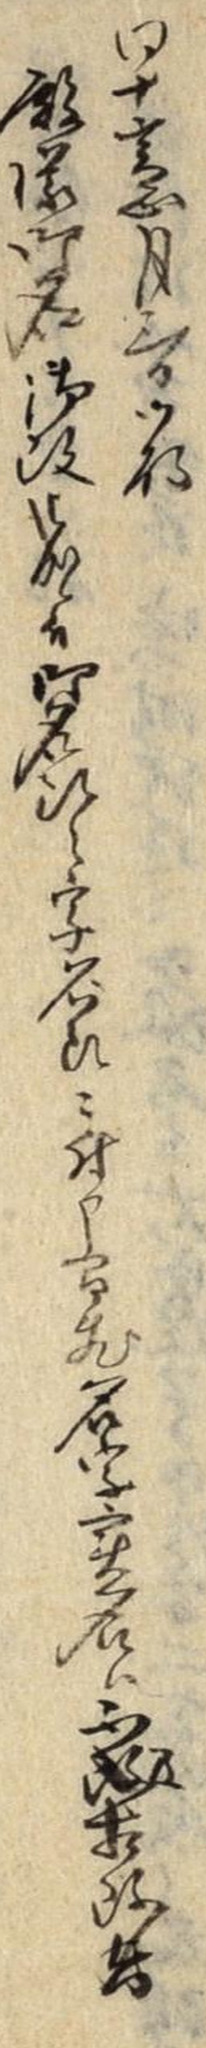殿様御名御改被成候に付御名頭之字名頭に付申間敷名字実名は不及相改旨
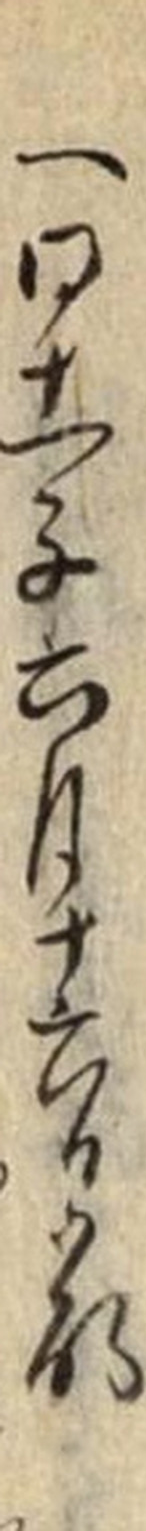一同十一子六月十六日御触
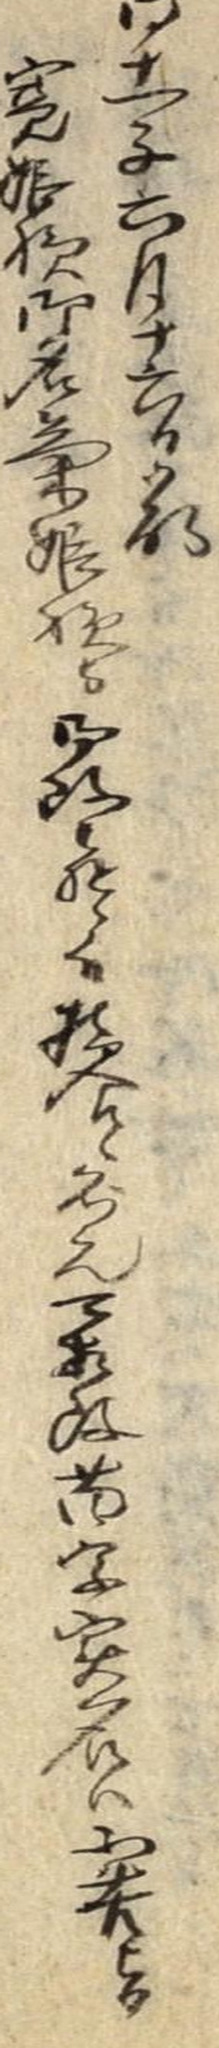寛姫様御名菊姫様と御改被遊候付指合候名元可相改苗字実名は不苦旨
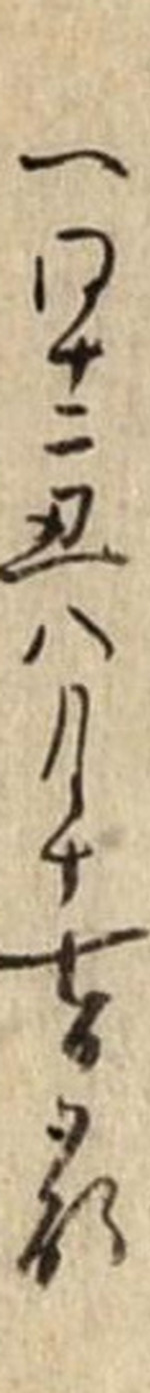一同十二丑八月十七日御触
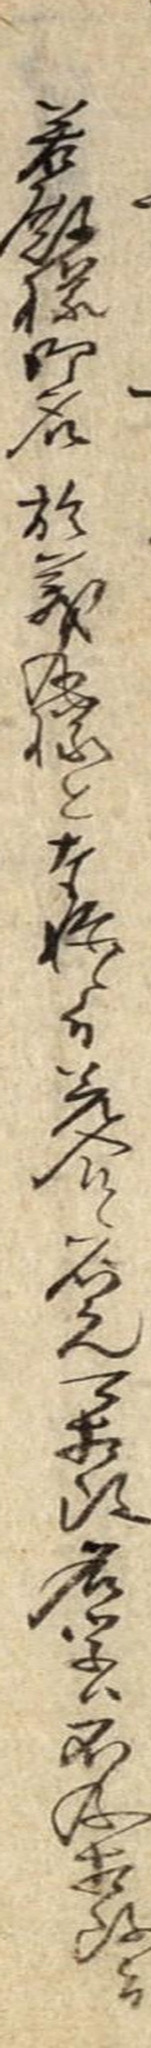若殿様御名於義丸様と奉称候付差合候名元可相改名字は不及相改旨
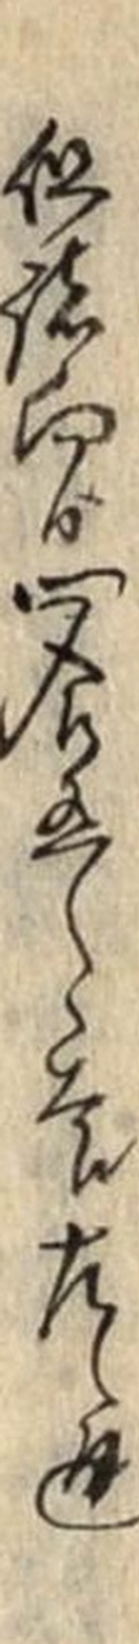但諸向ゟ問合有之候節左之通
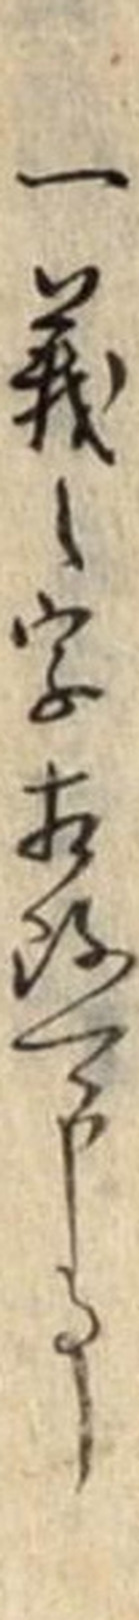一義之字相改可申事
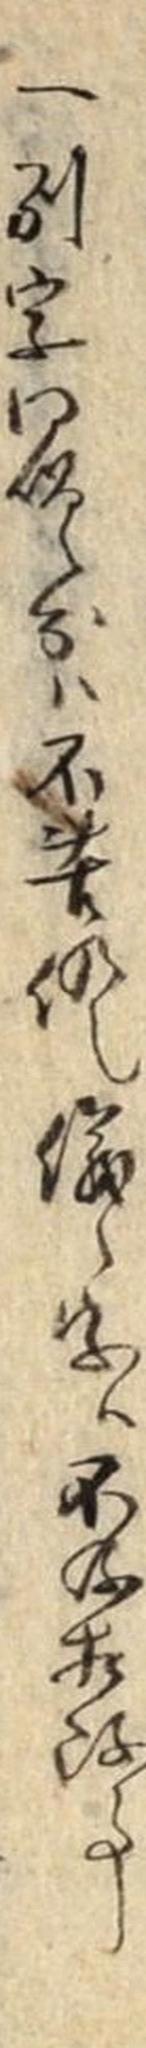一別字同唱之分は不苦仍之儀之字は不及相改候事
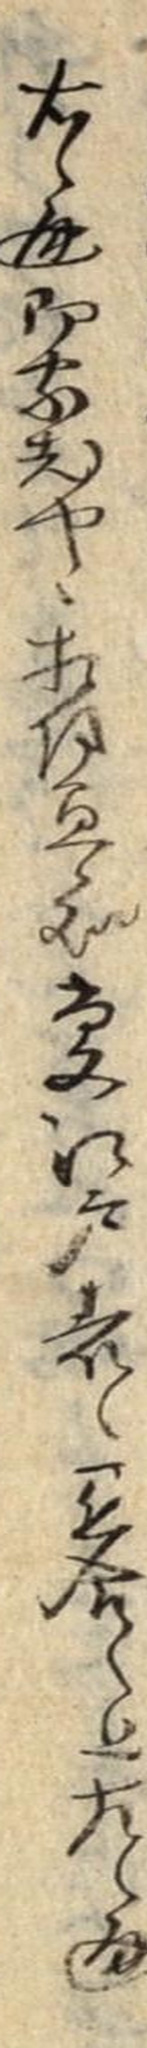右之通御家老中へ相伺置候処尚又江戸表へ懸合之上左之通
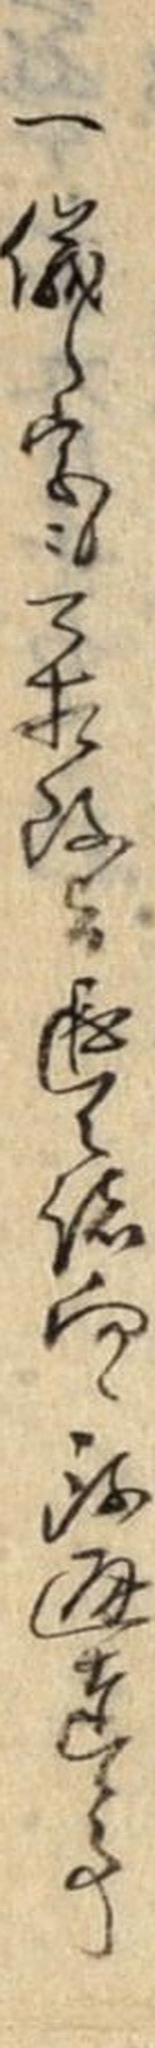一儀之字も可相改旨追々諸向へ致通達候事

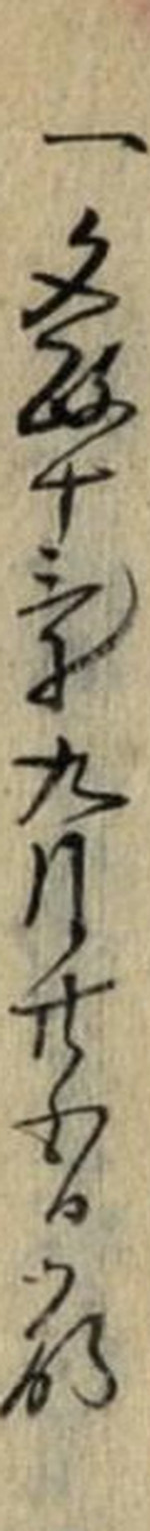一文政十三寅九月廿五日御触
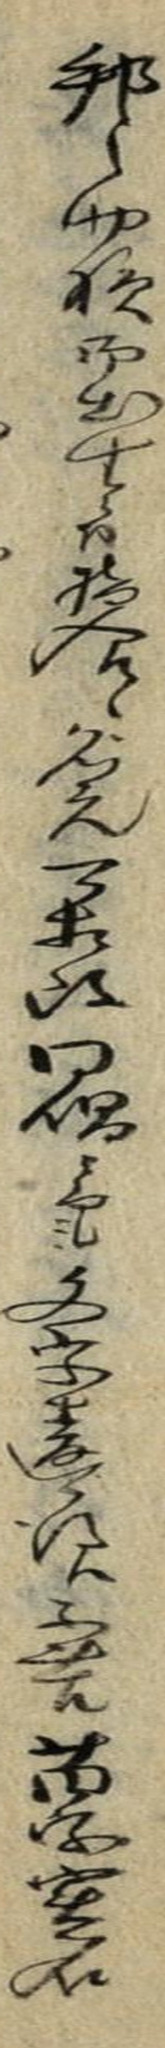邦之助様御出生に付指合候名元可相改同唱に而も文字違候得は不苦苗字実名
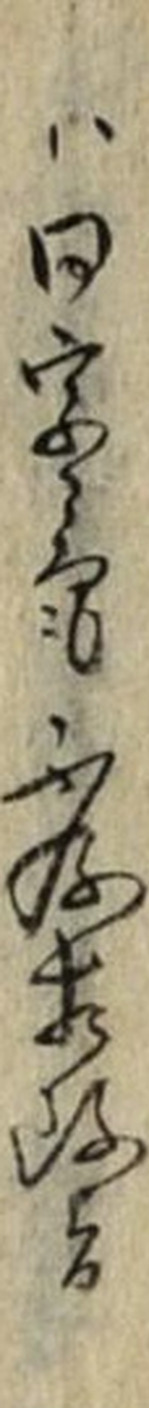は同字に而も不及相改旨
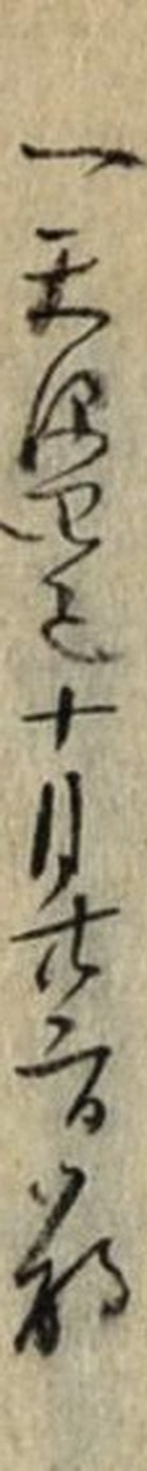一天保四巳十月廿二日御触
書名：蒐輯之部
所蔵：福井県文書館 Fukui Prefectural Archives
